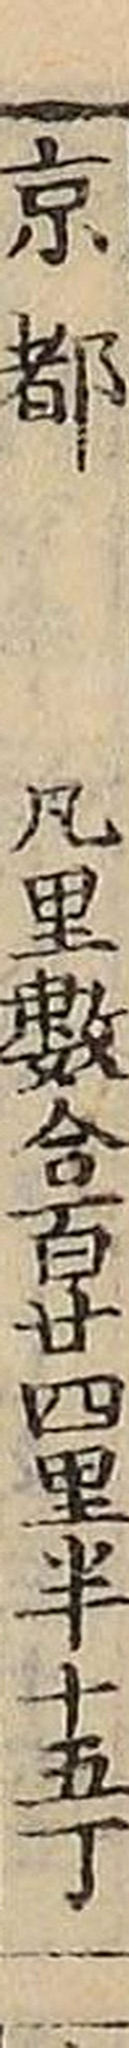京都凡里数合百廿四里半十五丁
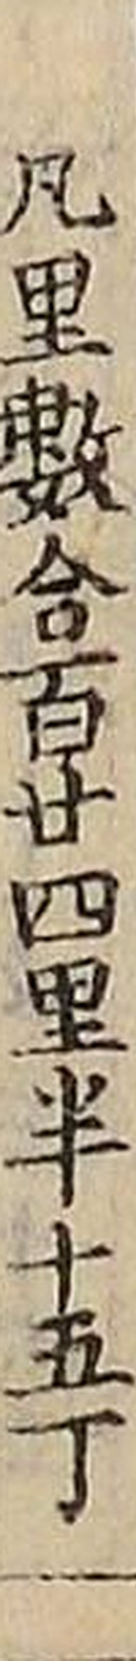京都凡里数合百廿四里半十五丁
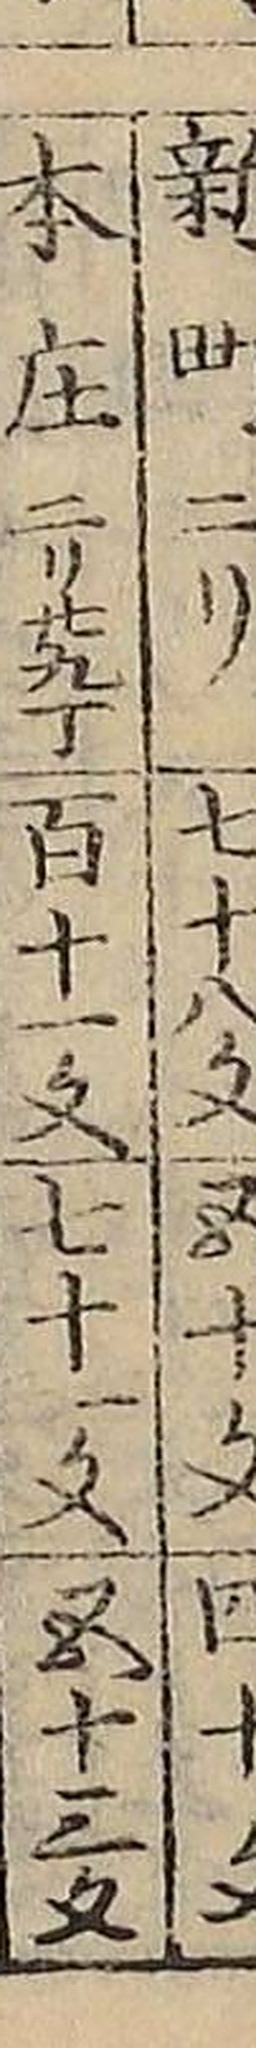本庄二リ廿九丁百十一文七十一文五十三文
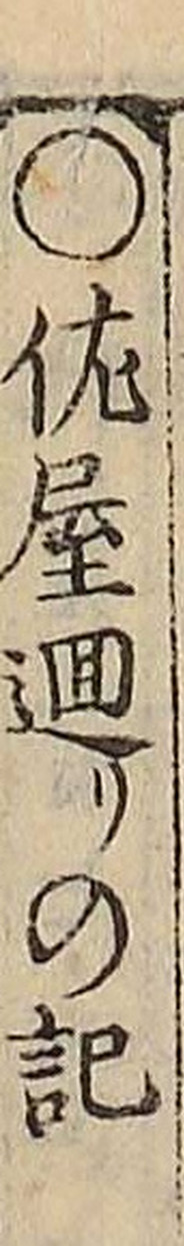○佐屋廻りの記
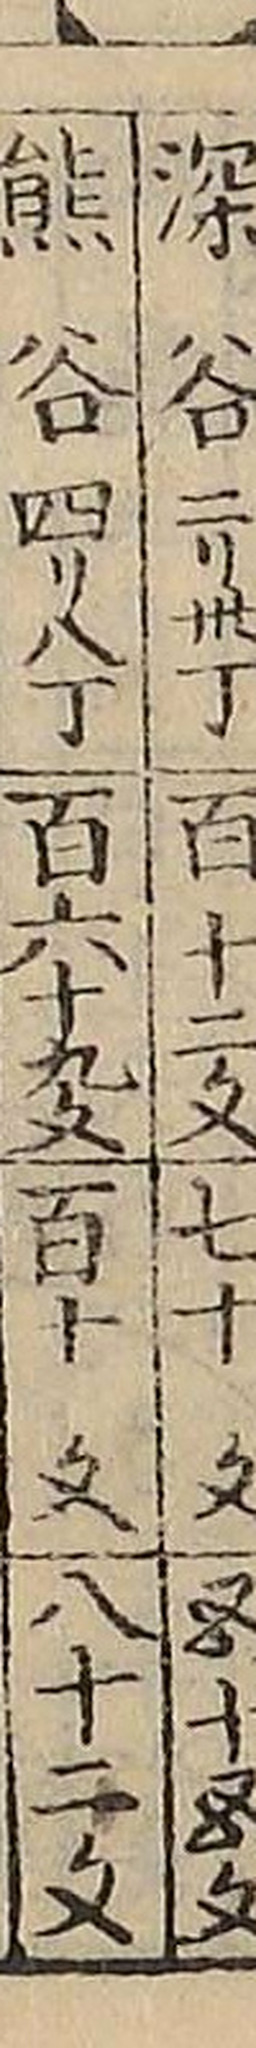熊合四リ八丁百六十九文百十文八十二文
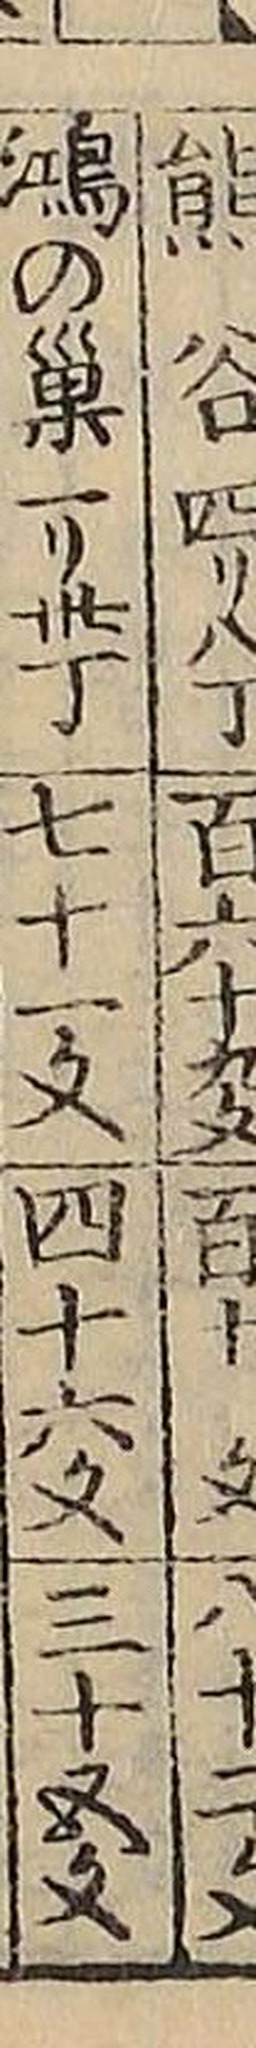板鼻一リ卅丁七十一文四十六文三十五文
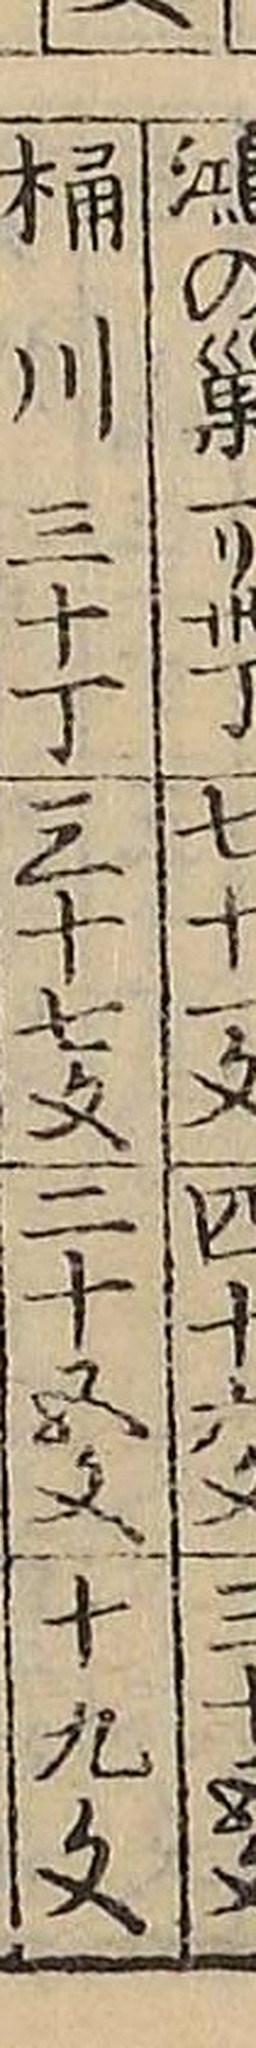桶川三十丁三十七文二十五文十九文
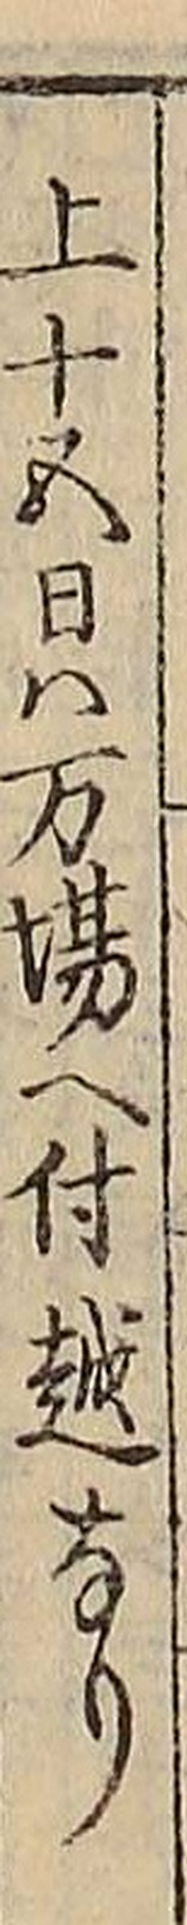上十五日は万場へ付越なり
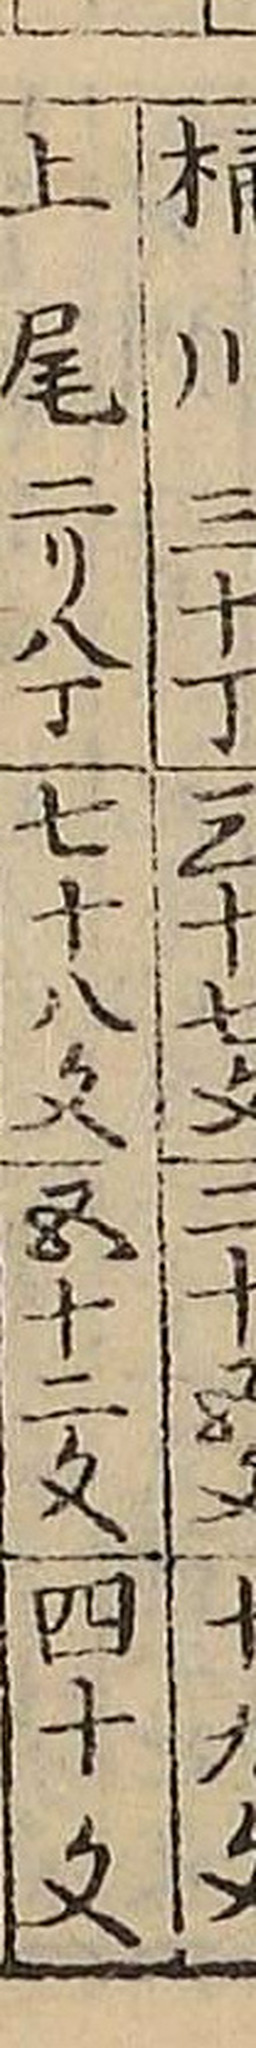上尾二リ八丁七十八文五十二文四十文
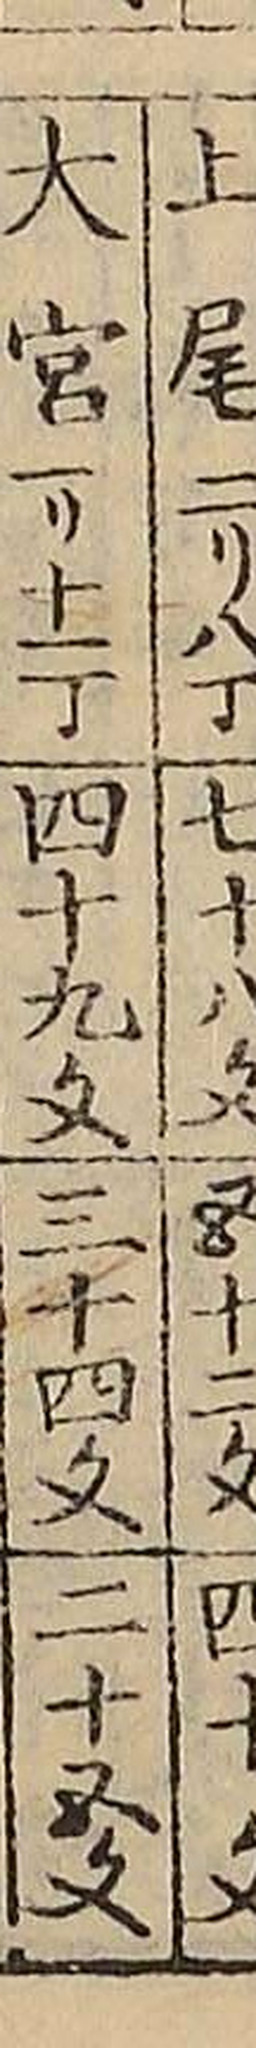大宮一リ十一丁四十九文三十四文二十五文
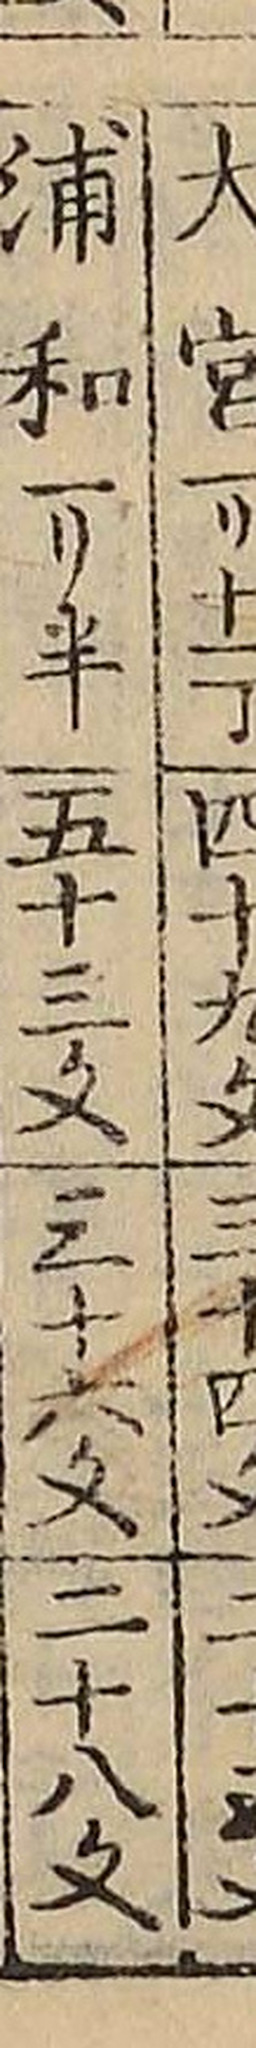浦和一リ半五十三文三十六文二十八文
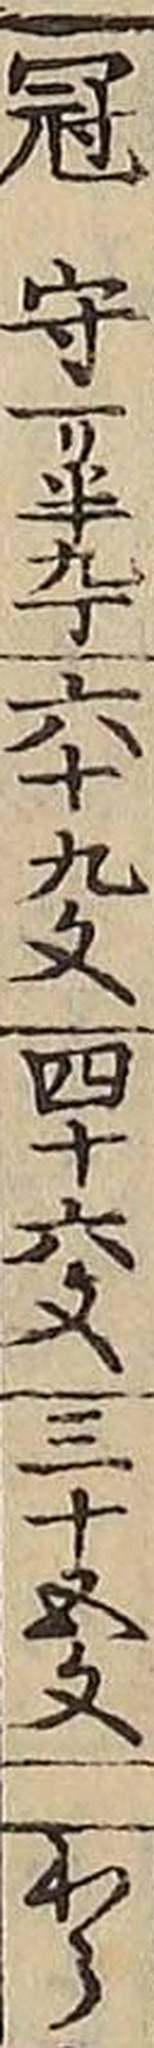冠守一リ半九丁六十九文四十六文三十五文
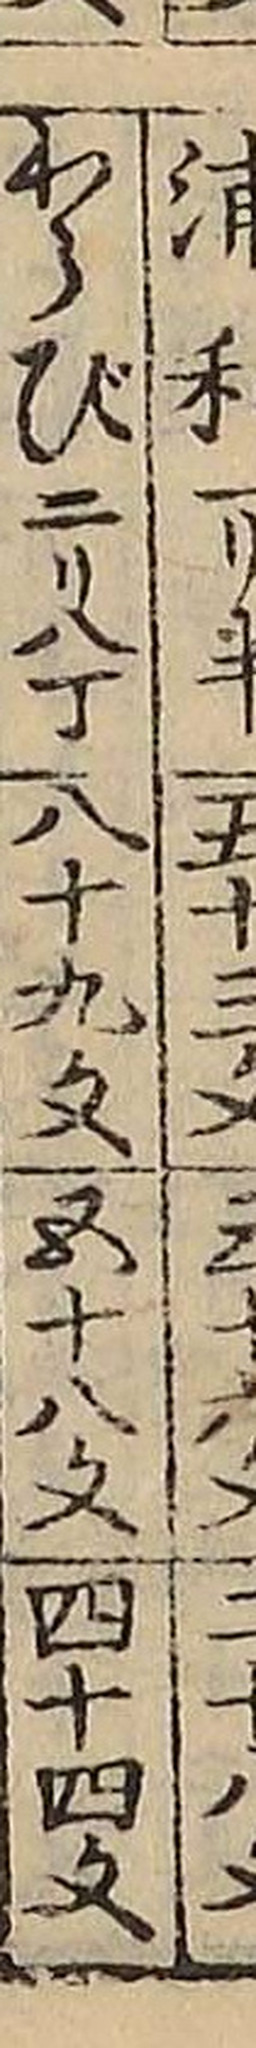わらび二リ八丁八十九文五十八文四十四文
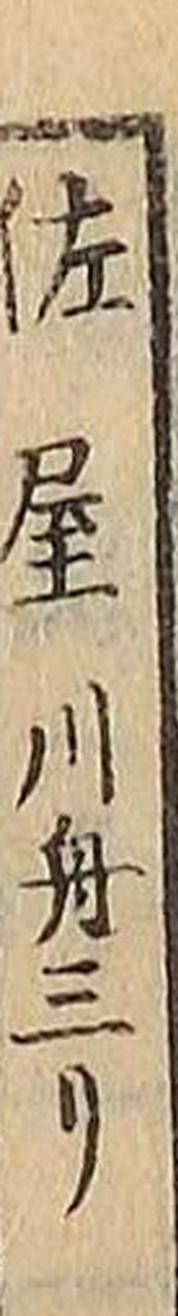佐屋川舟三リ
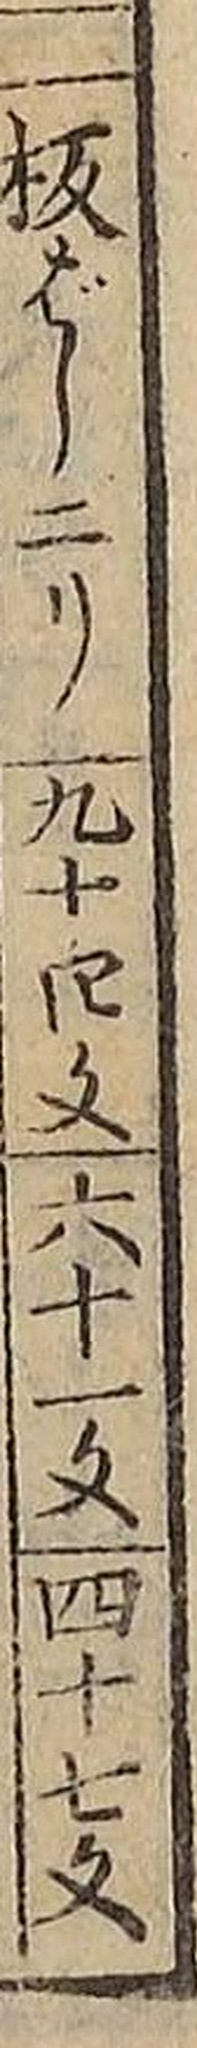板ばし二リ九十四文六十一文四十七文
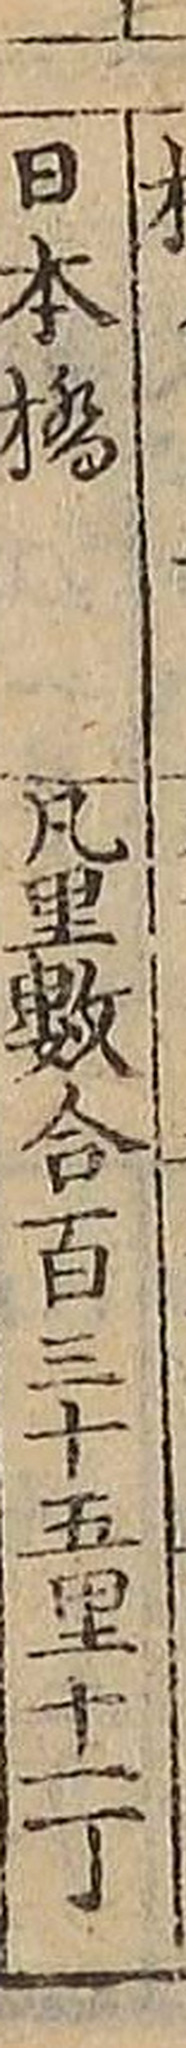日本橋凡里数合百三十五四里十一丁
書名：旅行用心集
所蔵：神戸大学附属図書館 国文学研究資料館
